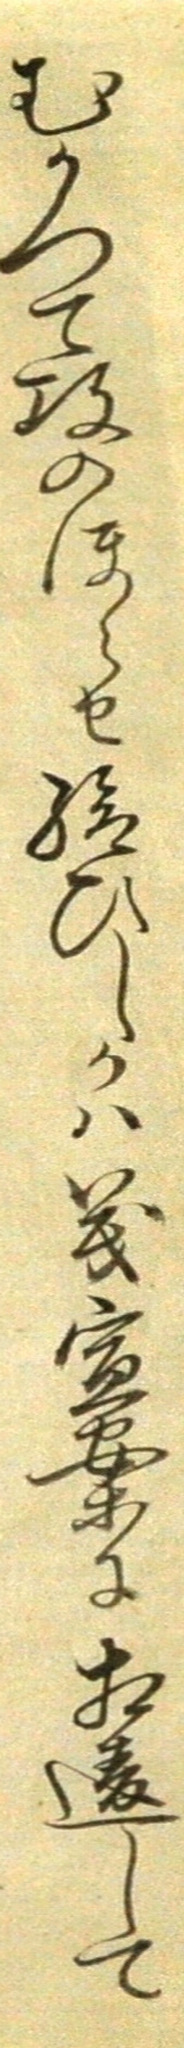むかつて攻のほらせ給ひしかは義宣案に相違して
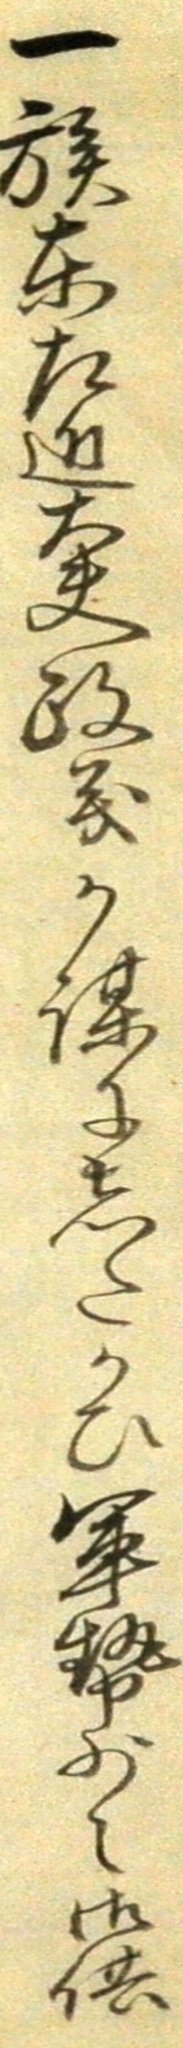一族東左近大夫政義か謀にしたかひ軍勢少々御供
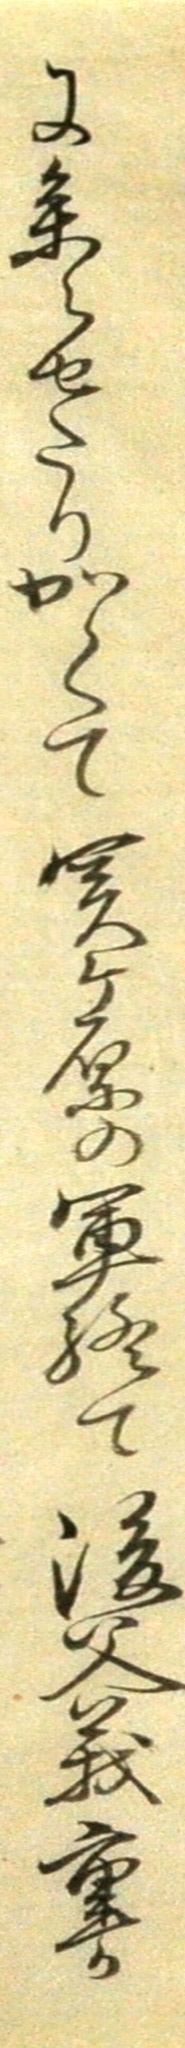に参らせたりかくて関ヶ原の軍終て後父義重か
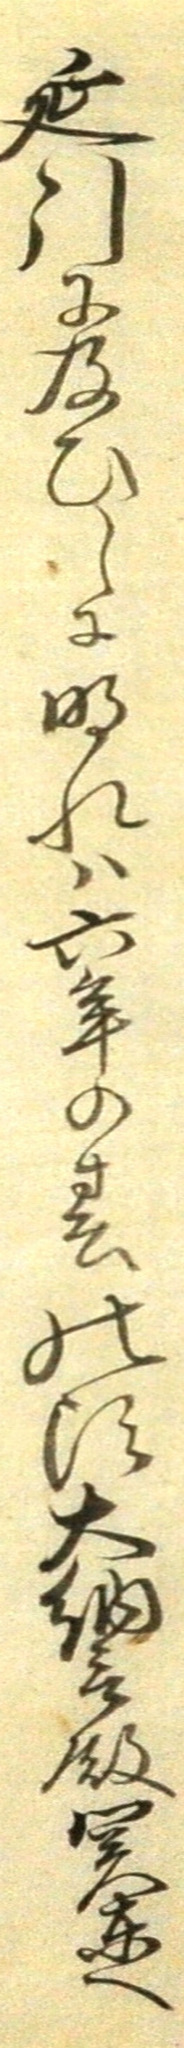延引に及ひしに明れは六年の春の頃大納言殿関東へ
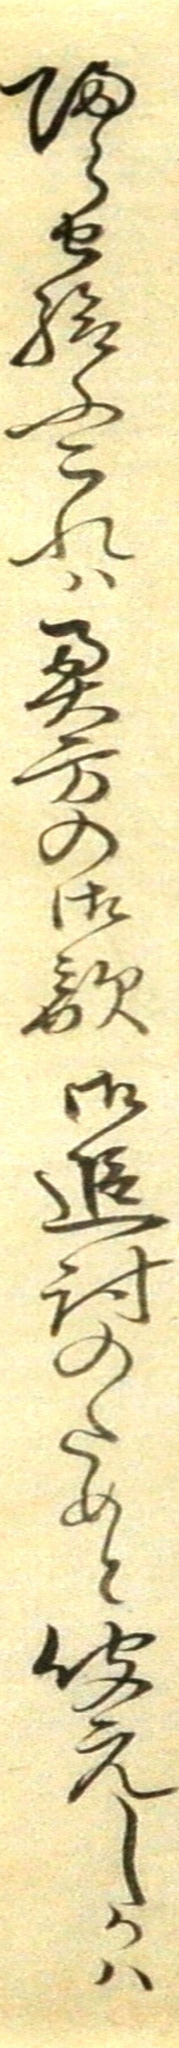帰らせ給ふこれは奥方の御敵御追討のためと聞えしかは
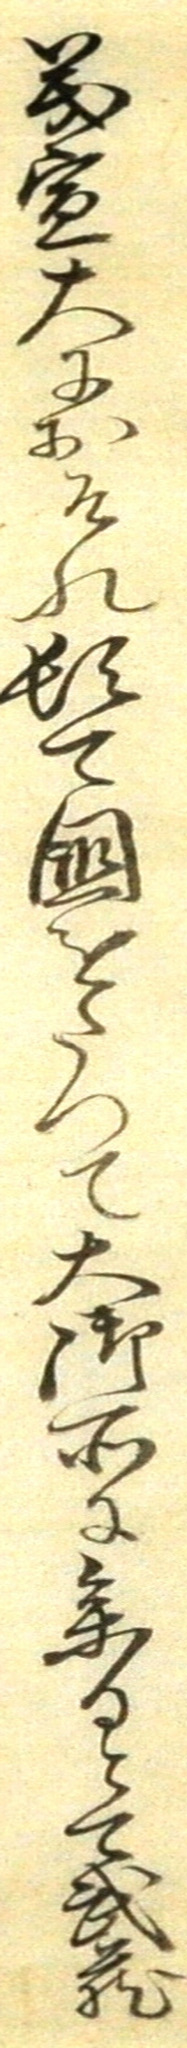義宣大におそれ頓て国をたつて大御所に参るとて武蔵
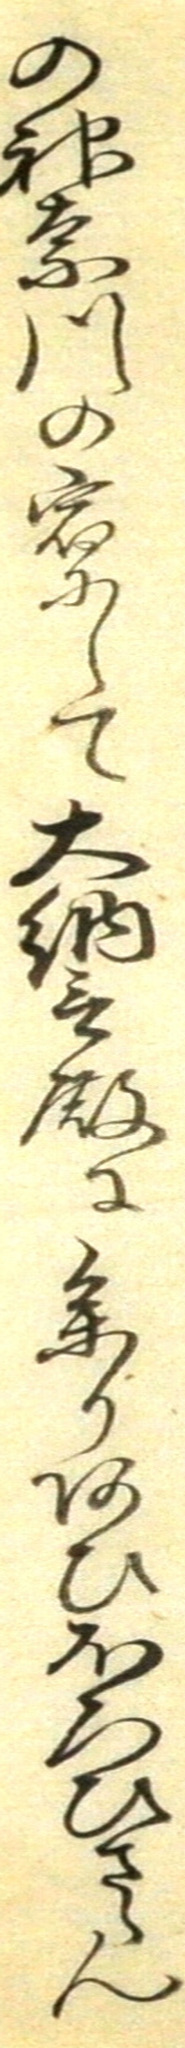の神奈川の宿にして大納言殿に参りあひほろひさらん
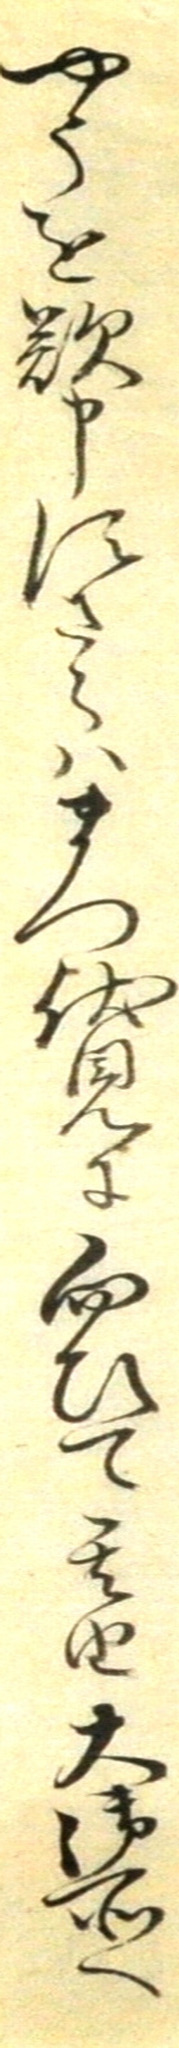やうを歎申すさらはまつ伏見に向ひて其由大御所へ
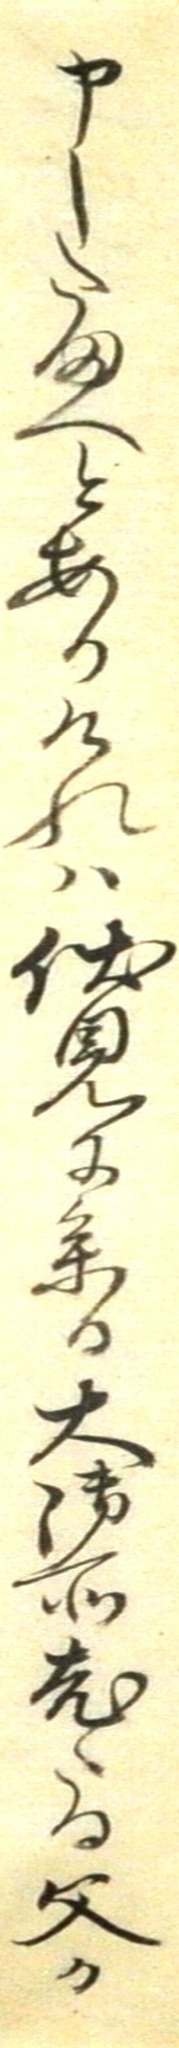申したまへとありけれは伏見に参る大御所老たる父か
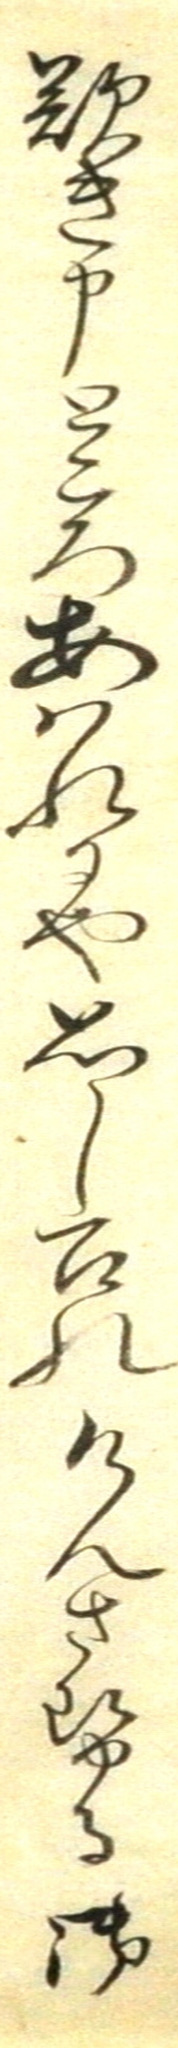歎き申ところあわれにや思し召れけんさせる御
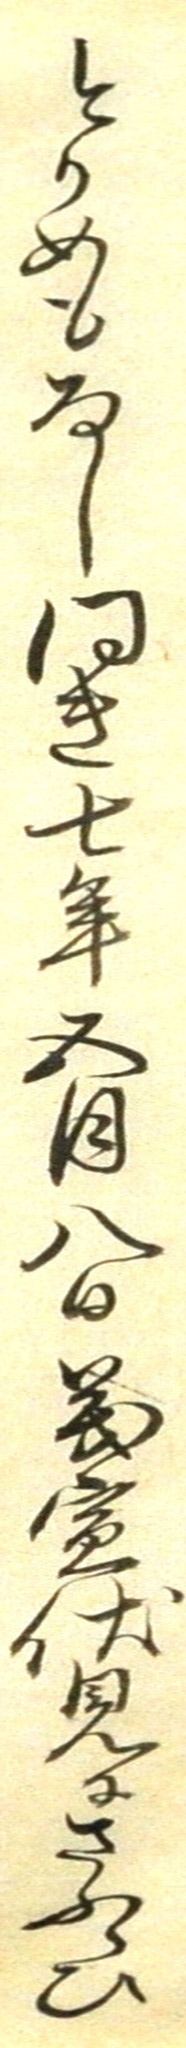とかめもなし同き七年五月八日義宣伏見にさふらひ
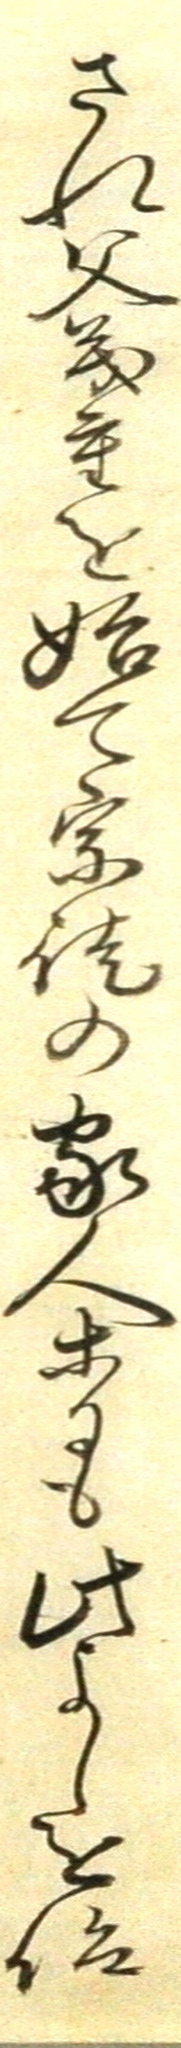され父義重を始て宗徒の家人等にも此よしを仰
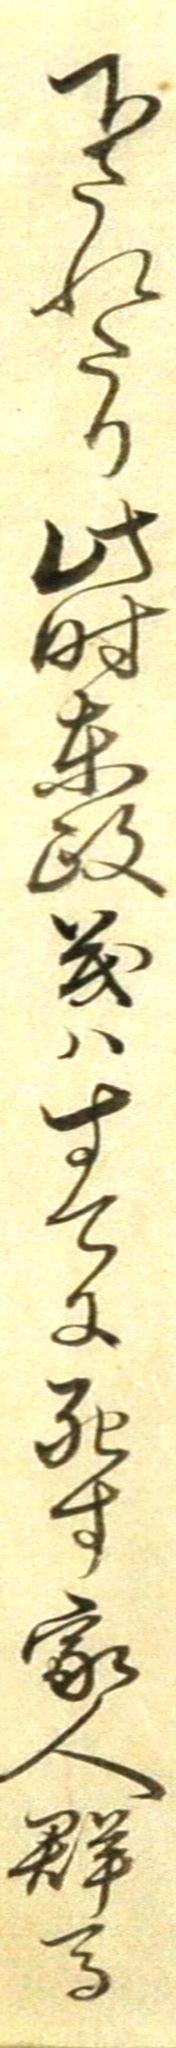下されたり此時東政義はすてに右馬死す家人群馬
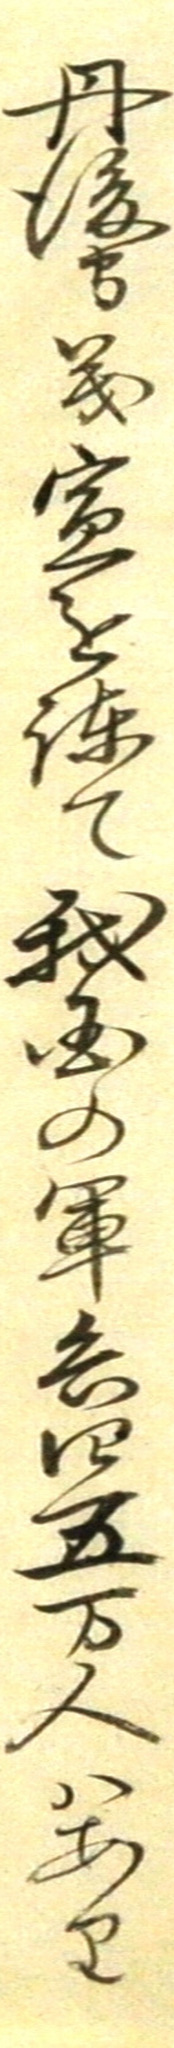丹後守義宣を諫て我国の軍兵四五万人はあり
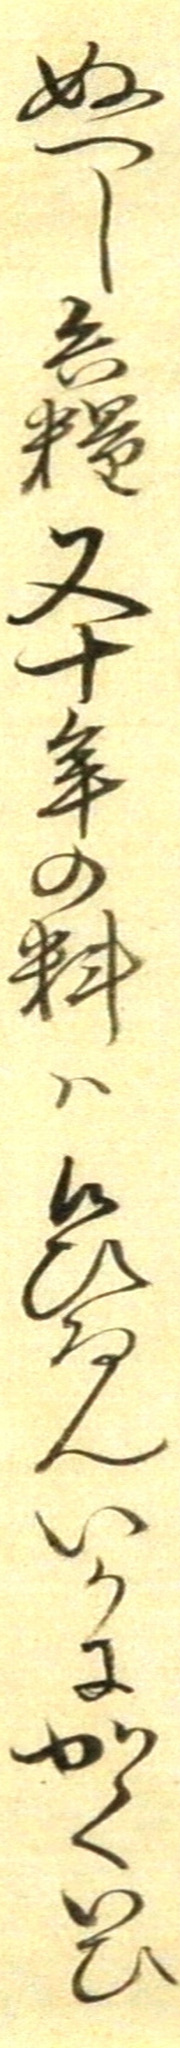ぬへし兵粮又十年の料は候ひなんいかにかくいひ
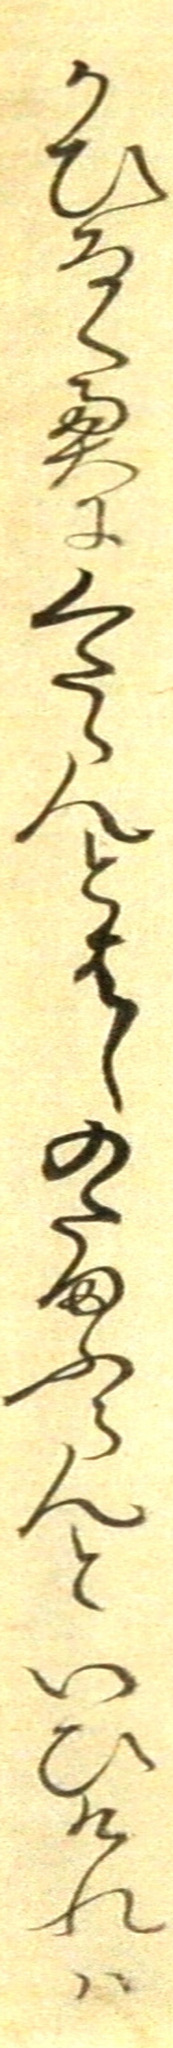かひなく奥にくたらんとはしのたまふらんといひけれは
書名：藩翰譜（八・下）
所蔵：伊那市立高遠町図書館・合同会社AMANE
